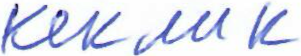кеклик
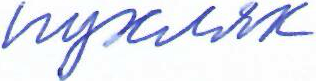пухляк
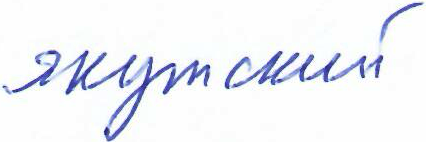якутский
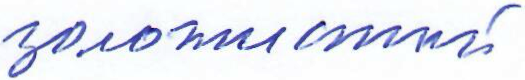золотистый
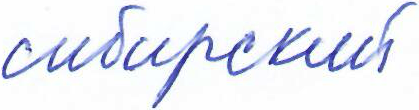сибирский
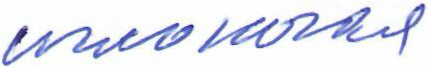иглоногая
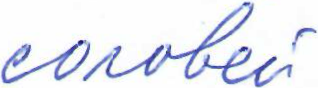соловей
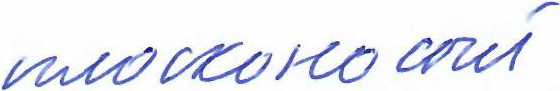плосконосый
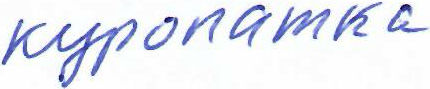куропатка
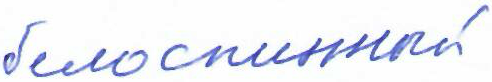белоспинный
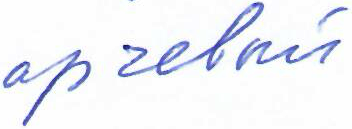арчевый
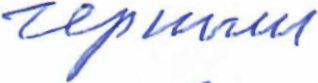черныш
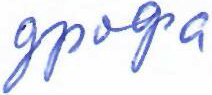дрофа
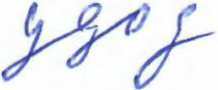удод
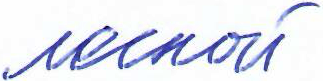лесной
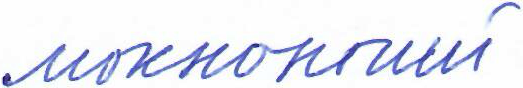мохноногий
